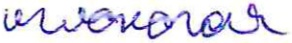иглоногая
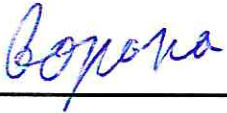ворона
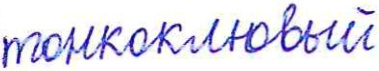тонкоклювый
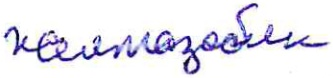желтозобик
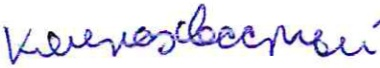клинохвостый
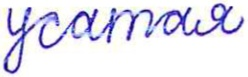усатая
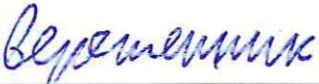веретенник
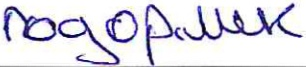подорлик
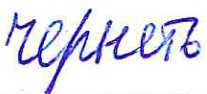чернеть
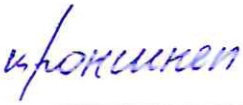кроншнеп
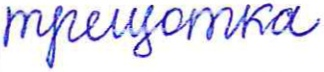трещотка
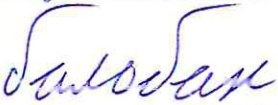балобан
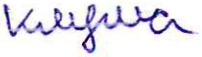клуша
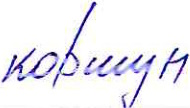коршун
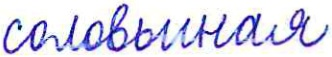соловьиная
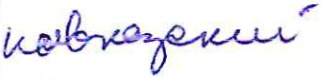кавкозский
